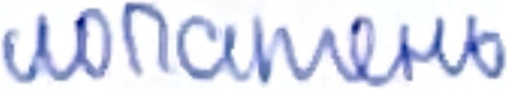лопатень
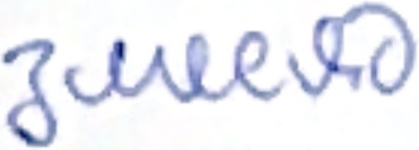змееяд
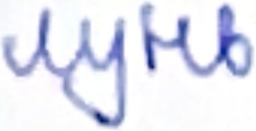лунь
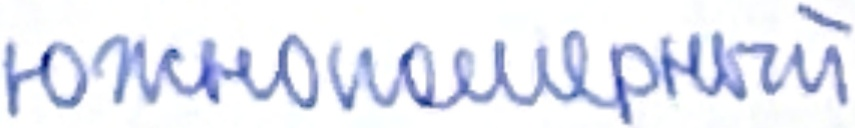южнополярный
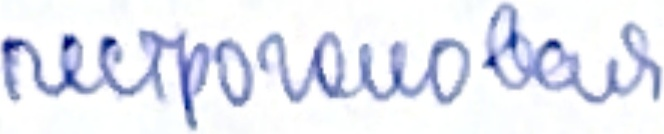пестроголовая
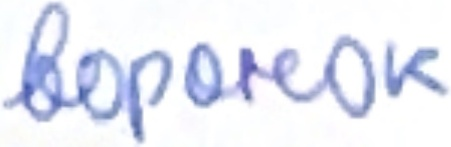воронок
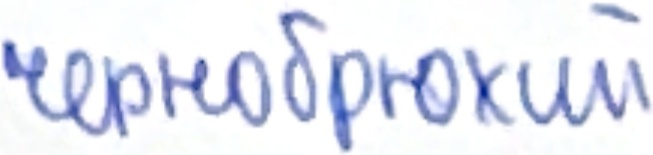чернобрюхий
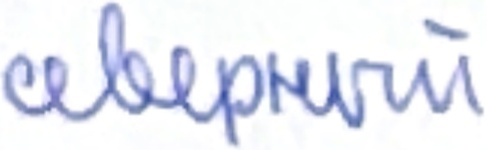северный
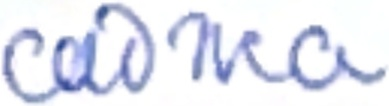саджа
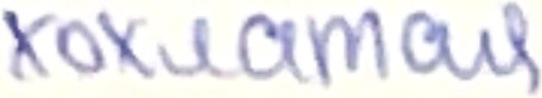хохлатая
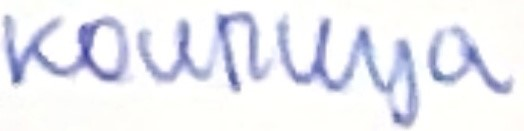колпица
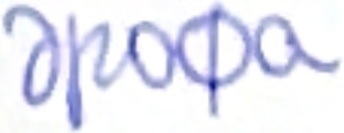дрофа
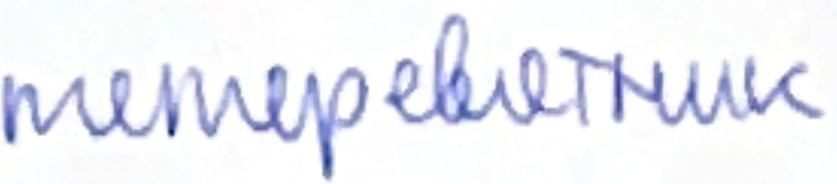тетеревятник
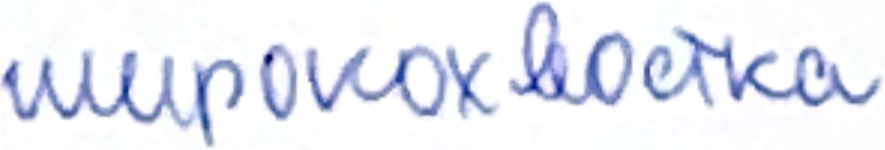широкохвостка
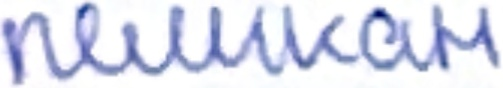пеликан
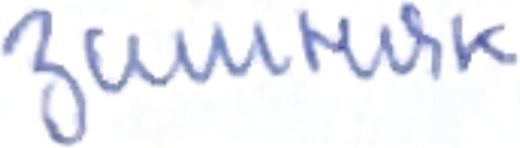зимняк
